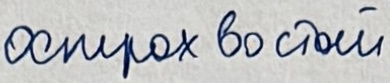острохвостый
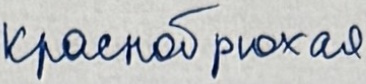красноб рюхая
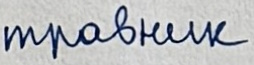травник
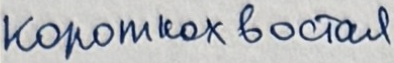короткохвостая
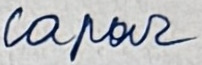сарыч
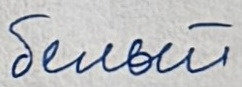белый
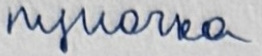пуночка
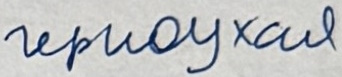черноухая
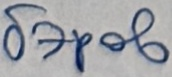бэров
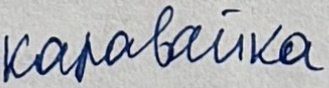каравайка
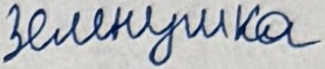зеленушка
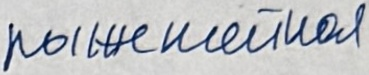рыжешейная
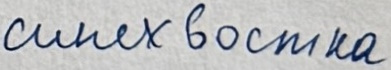синехвостка
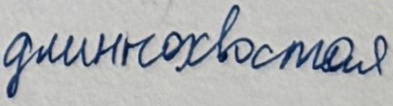длиннохвостая
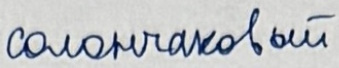солончаковый
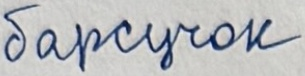барсучок
